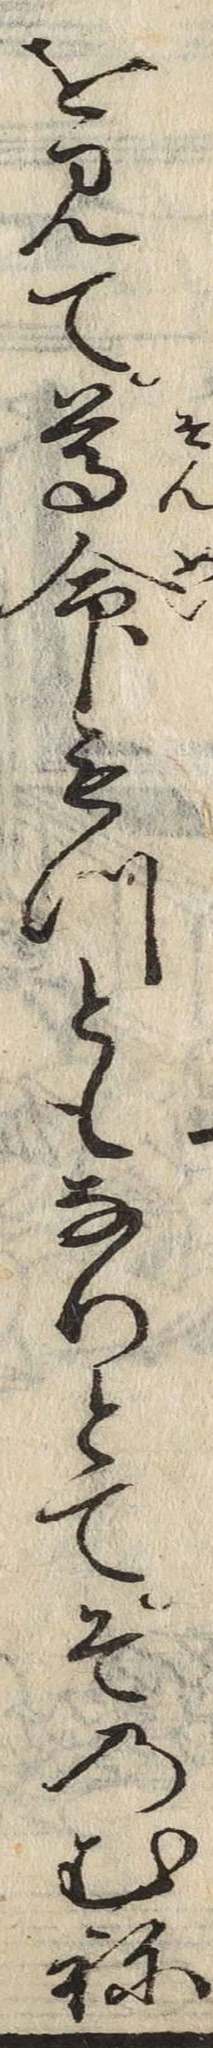を見て尊命もつともなりとて。そのむね
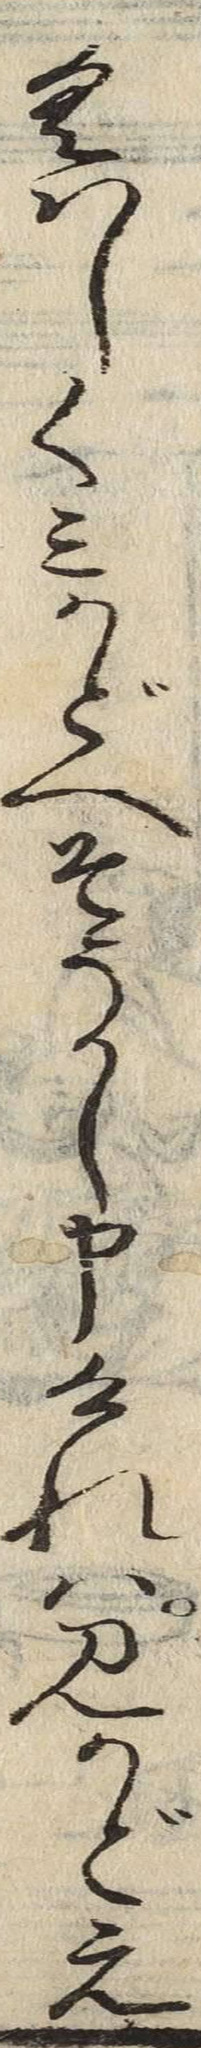くはしくみかどへそうかし申けれは。みかどえ
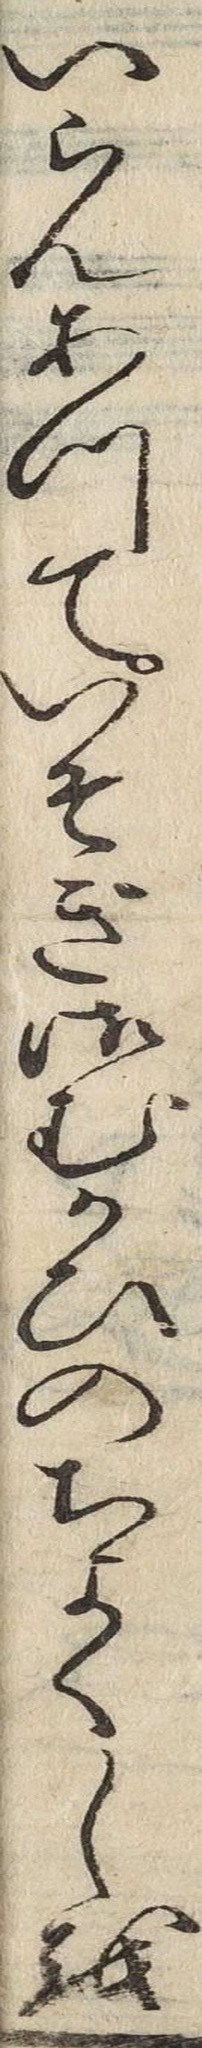いらんあつて。いそぎ御むかひのちよくしを
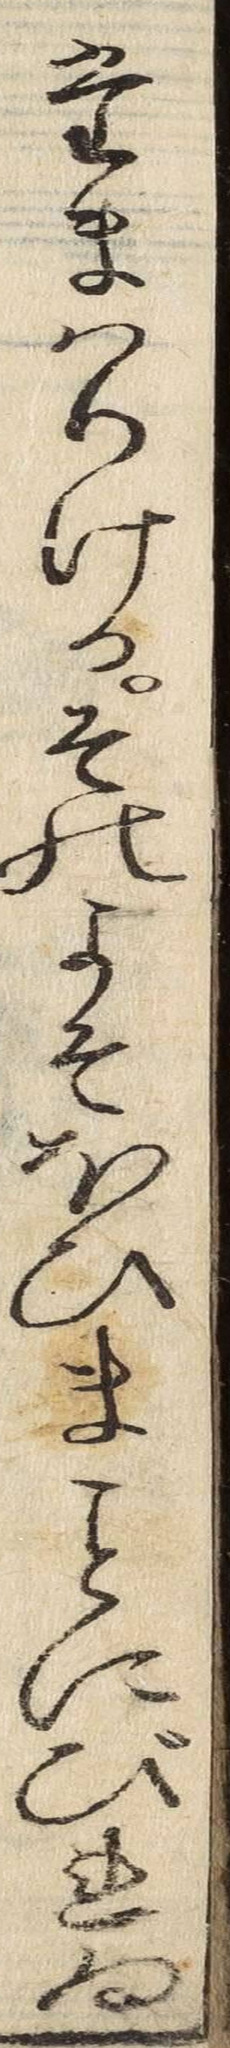たまはりける。そのよそほひまことに。びれゐ
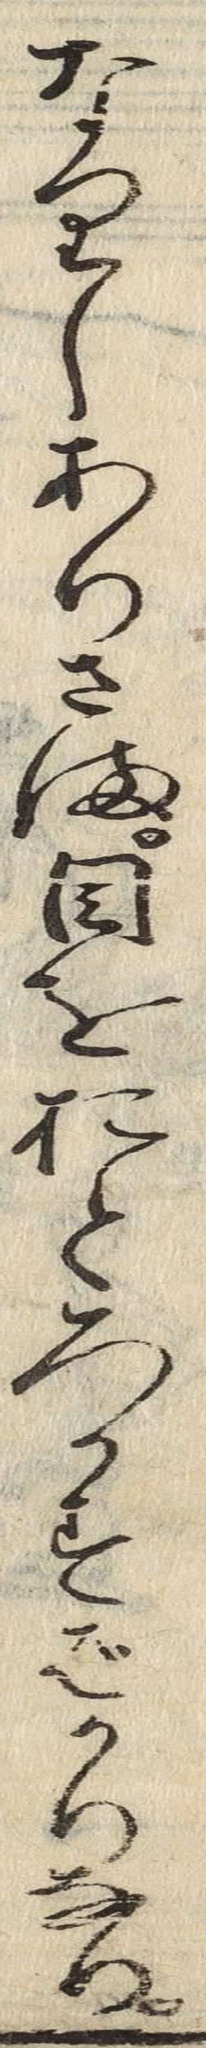なりしありさま。目をおとろかすばかりなり。
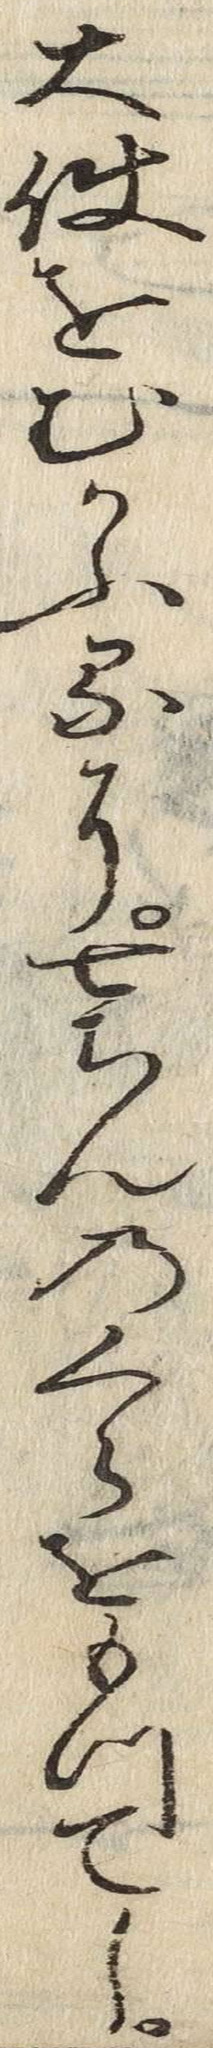大使をむかふるに。七ちんのくらをもつてし。
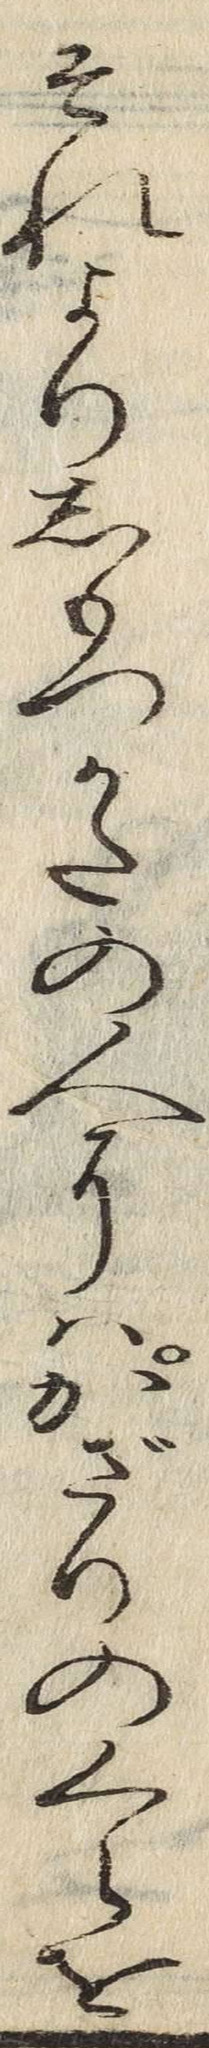それよりしもつかたの人には。かざりのくらを
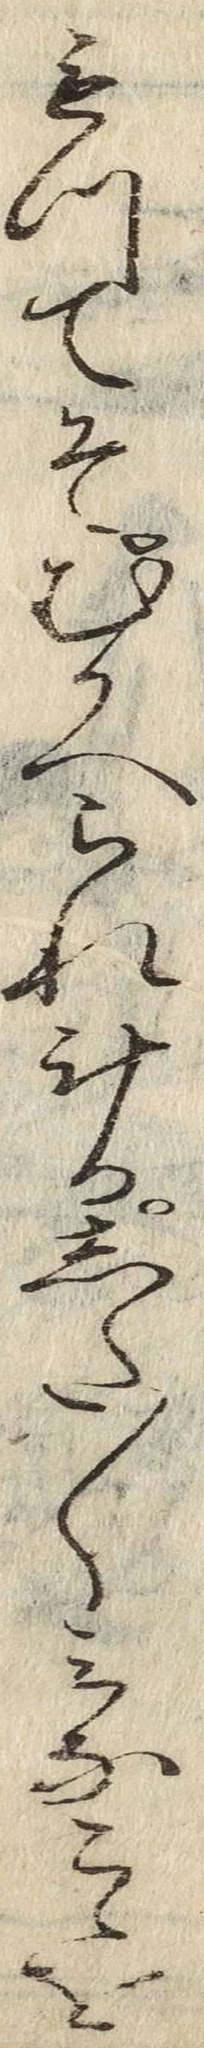もつてそ。むかへられける。した〳〵みなこゝを
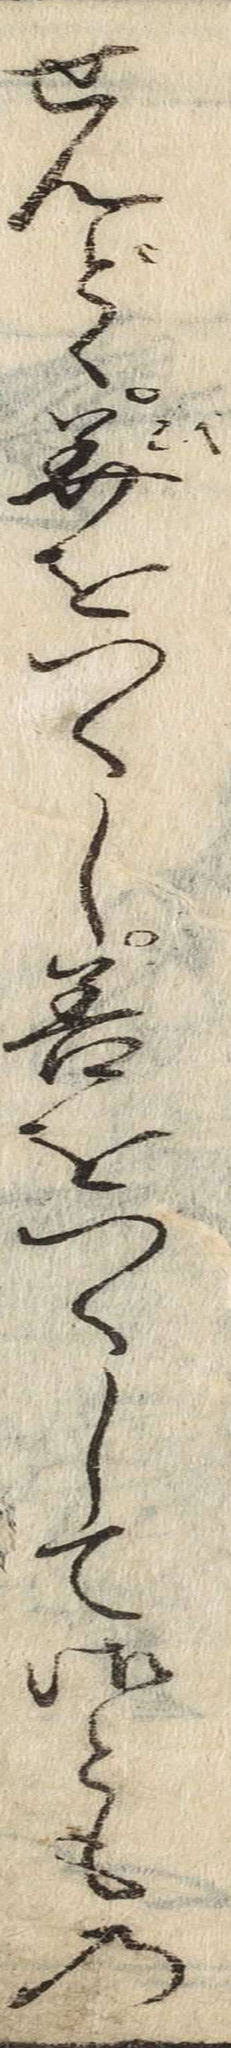せんどゝ。美をつくし。善をつくして御ともの
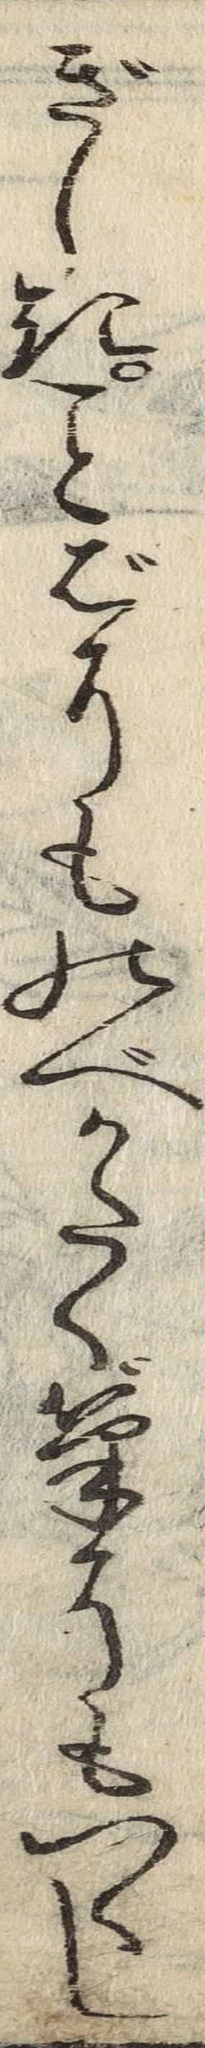ぎしき。ことばにものべかたく。筆にもつくし
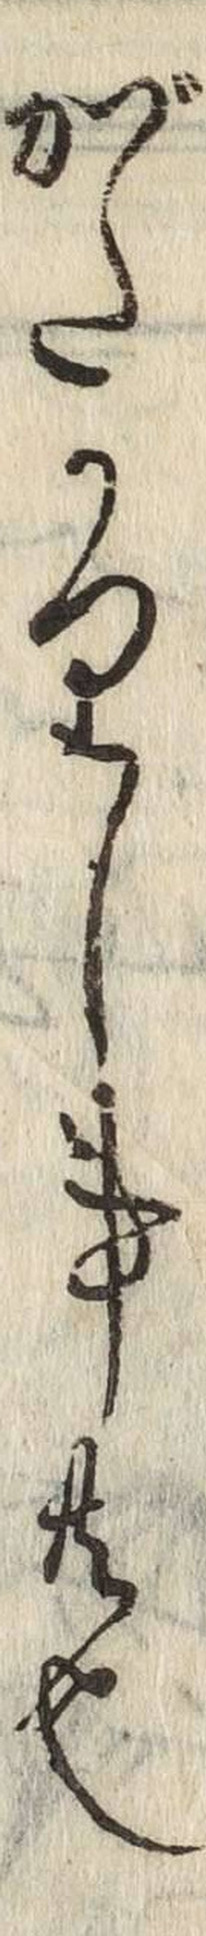がたかりし事共也

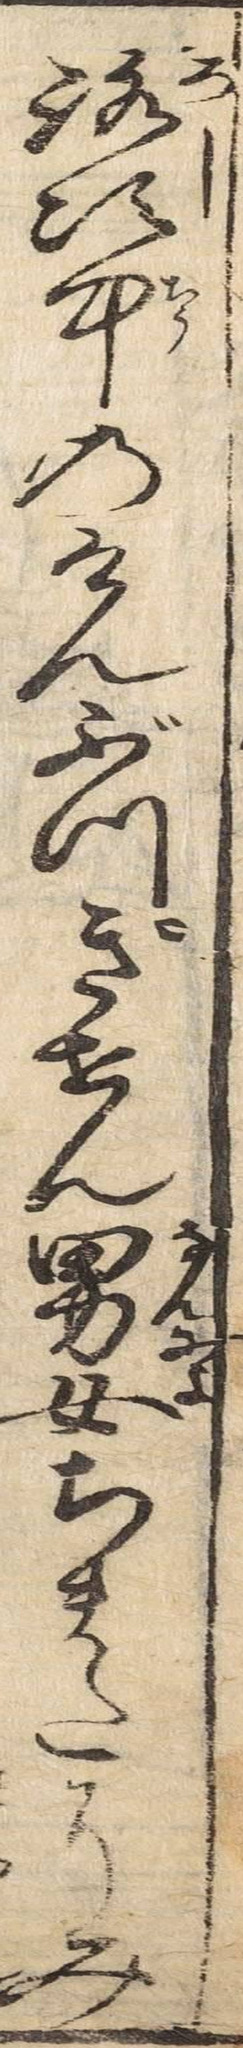路次中のけんぶつ。きせん男女ちまたにみ
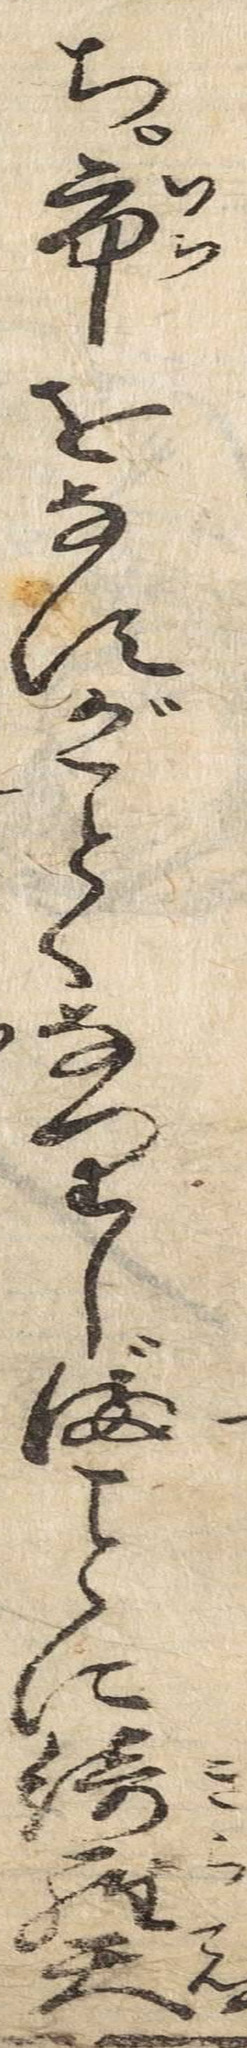ち。市をなすがごとくなりし。まことに綺羅天
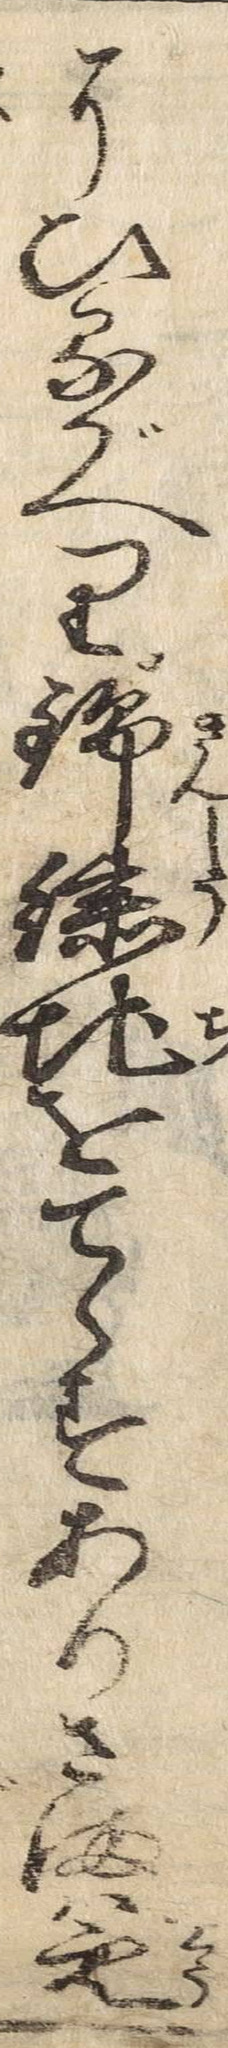にひるがへり。錦繍地をてらすありさまは。空
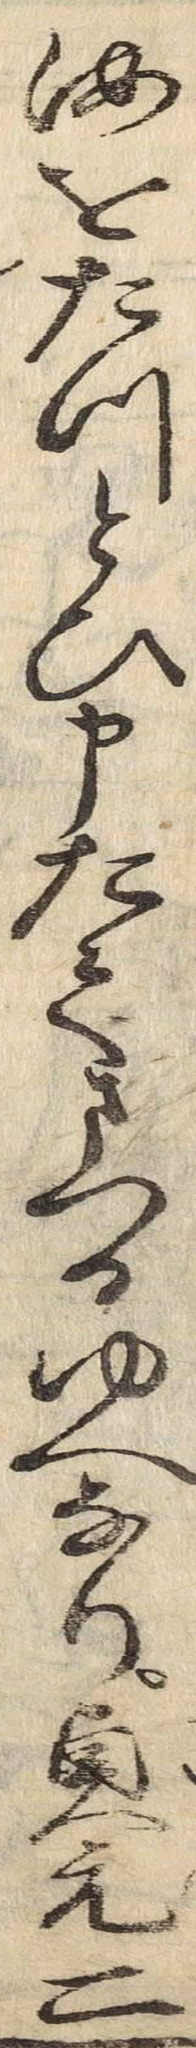海をたつとひ申たてまつるゆへなり。貞元二
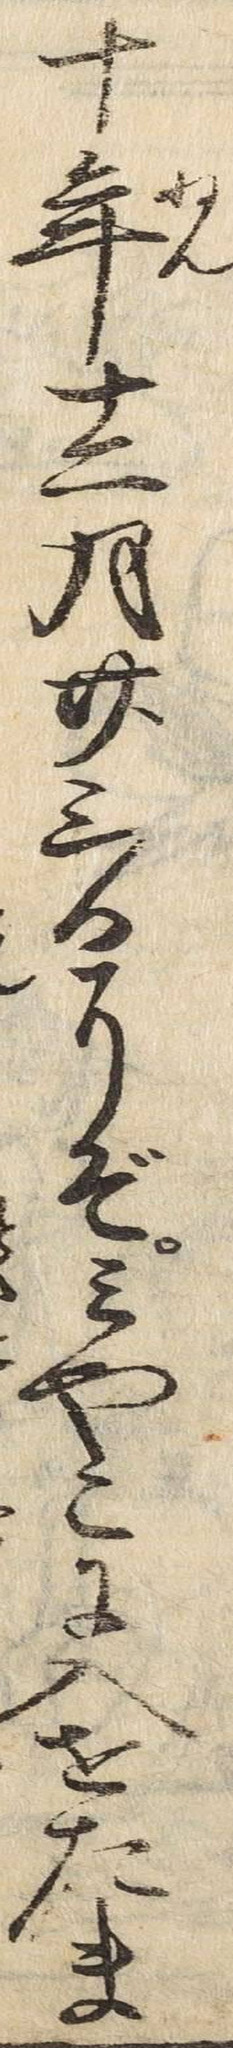十年十二月廿三日にぞみやこに入せたま
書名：弘法大師御傳記
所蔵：京都府立京都学・歴彩館 国文学研究資料館
